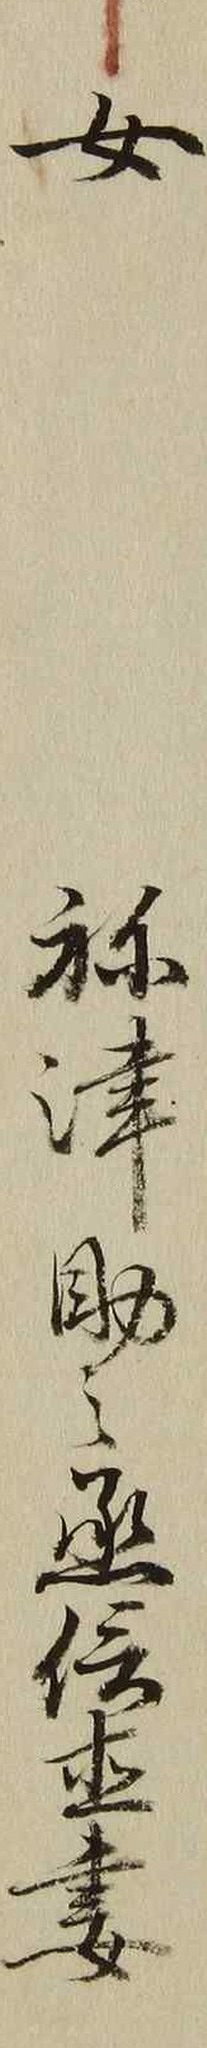女禰津助之丞信直妻
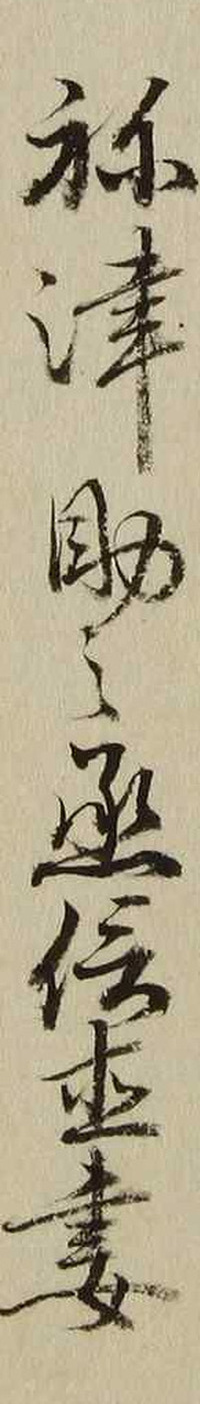女禰津助之丞信直妻
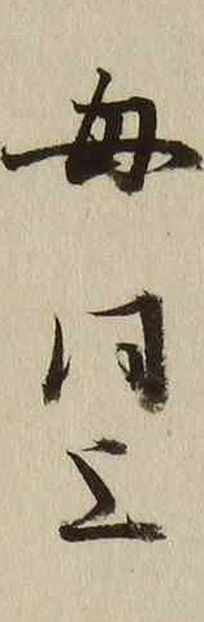母同上
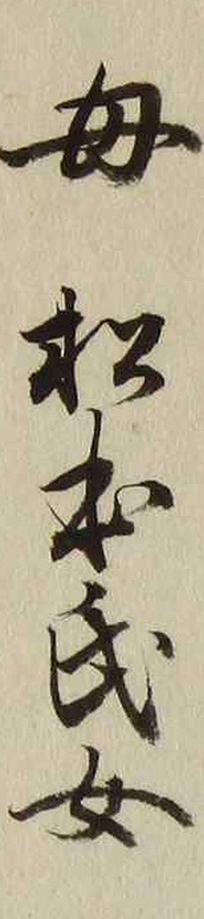母松本氏女

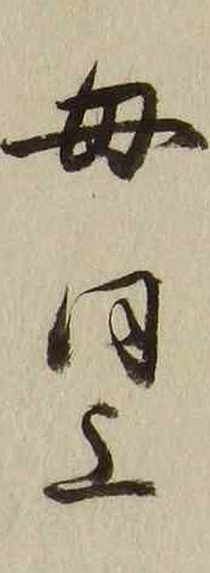母同上
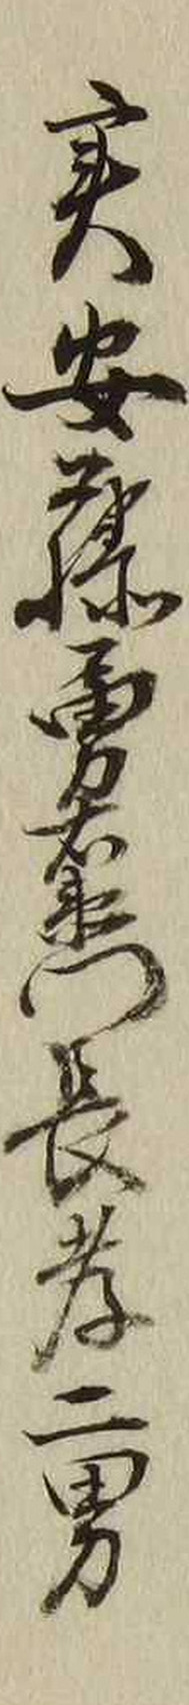実安藤勇右衛門長孝二男
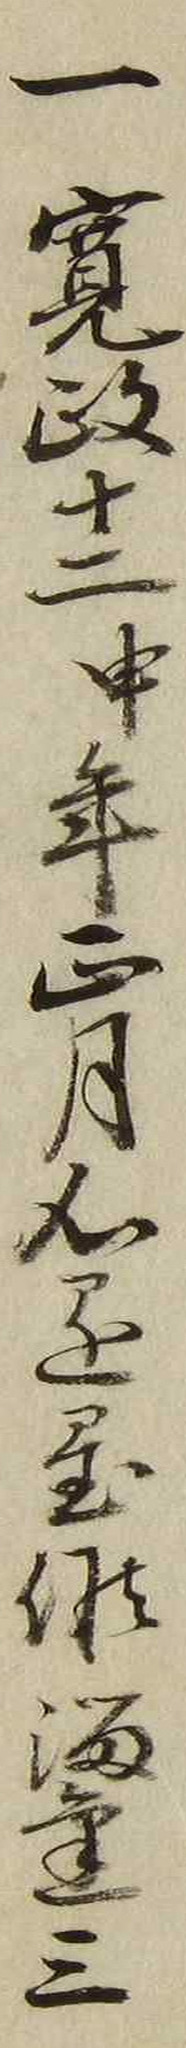一寛政十二申年正月心懸置候溜金三
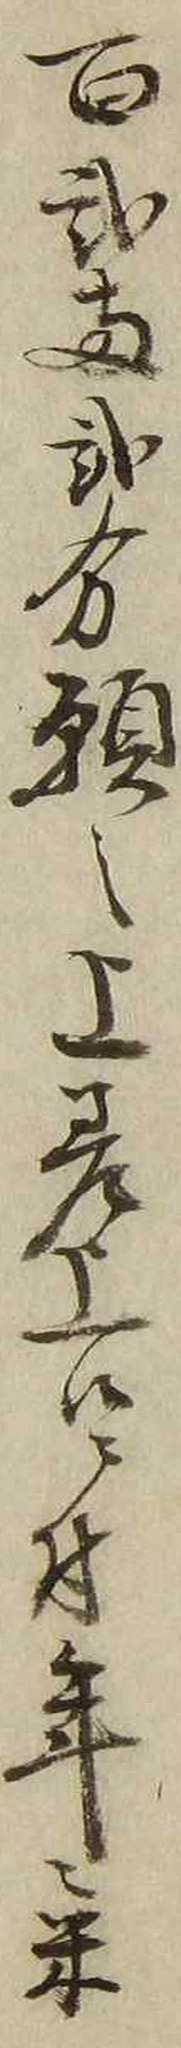百弐両弐分願之上差上候ニ付年々米
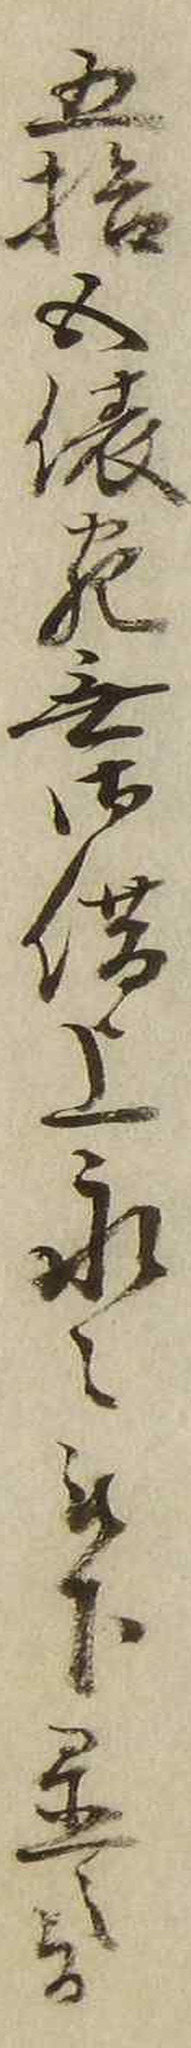五拾五俵宛無御借上永々被下置之旨

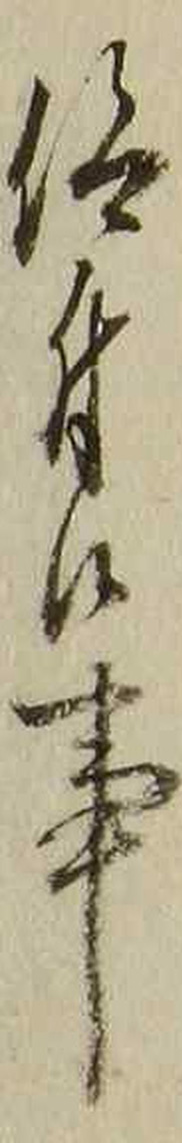仰付候事
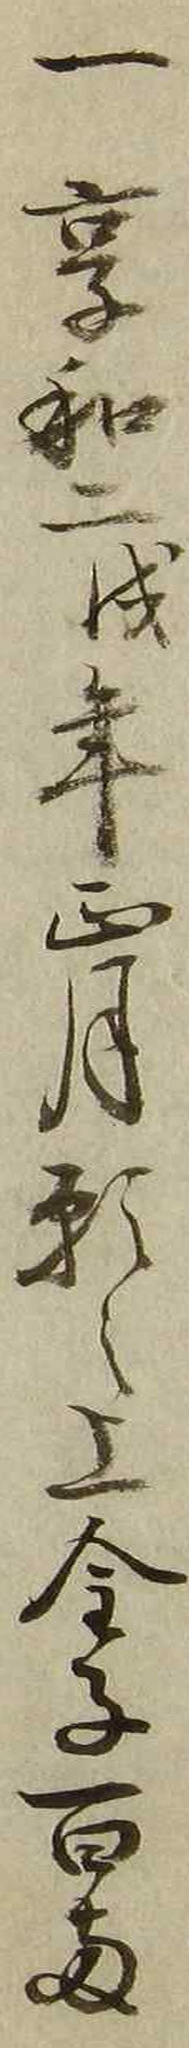一享和二戌年正月願之上金子百両
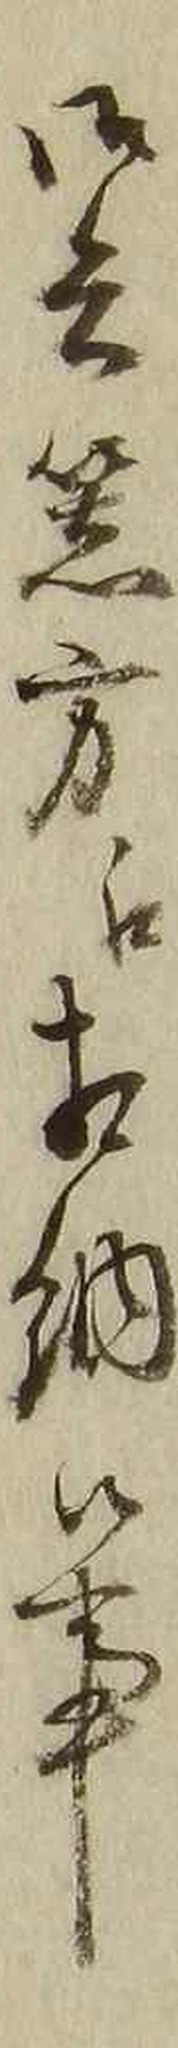御兵器方江相納候事
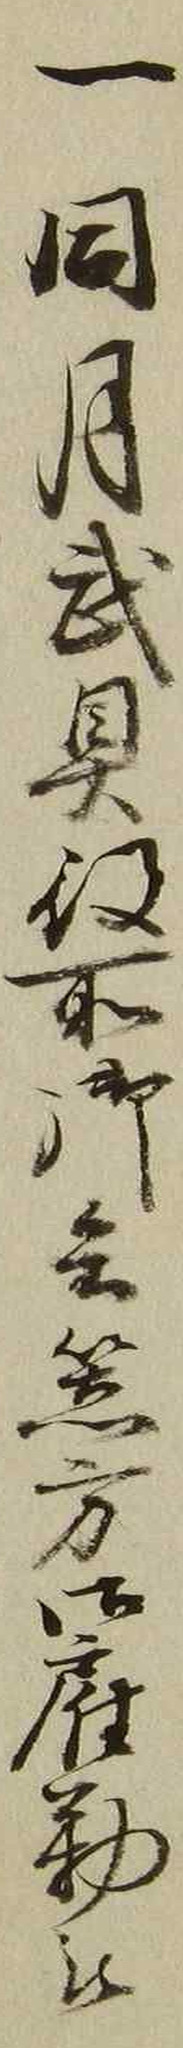一同月武具役所御兵器方御雇勤被
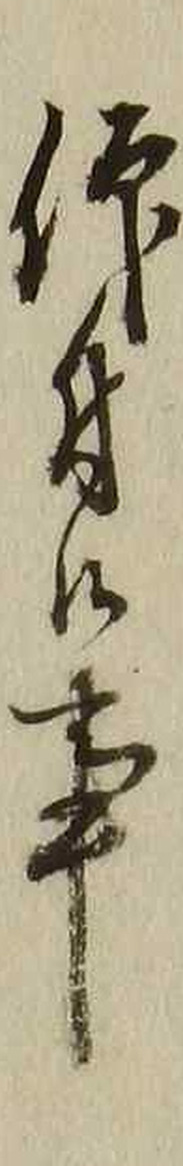仰付候事
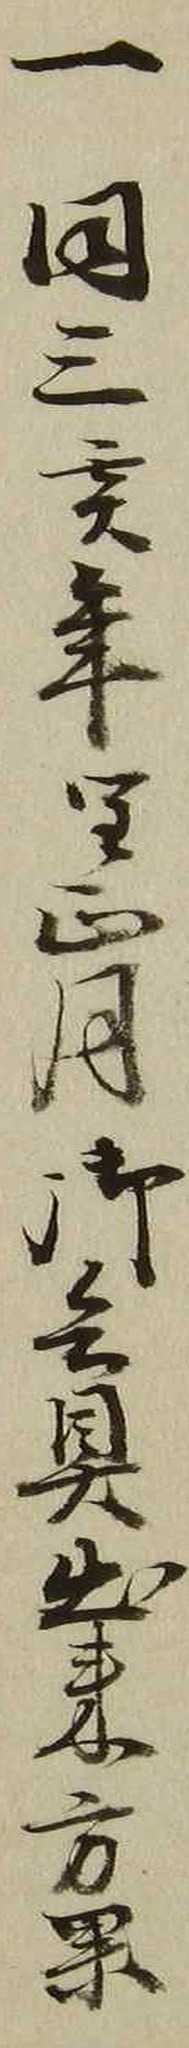一同三亥年閏正月御兵具出来方果
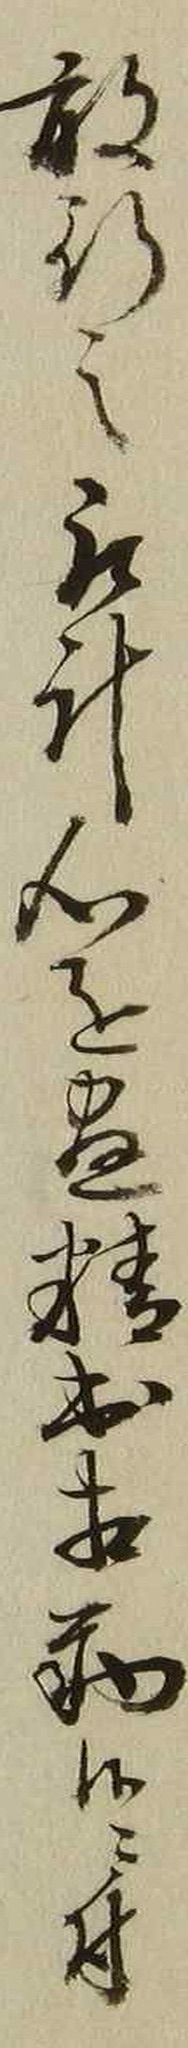敢行之取計心を尽精出相勤候ニ付
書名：諸士系譜　巻之36　は之部4
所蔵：会津若松市立会津図書館
